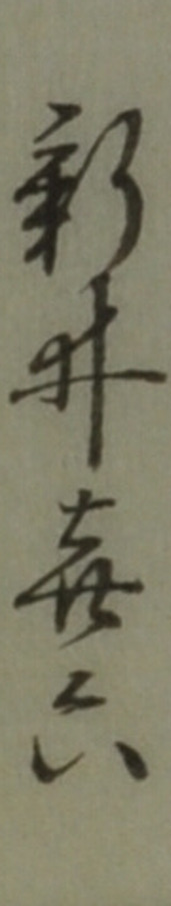新井喜六
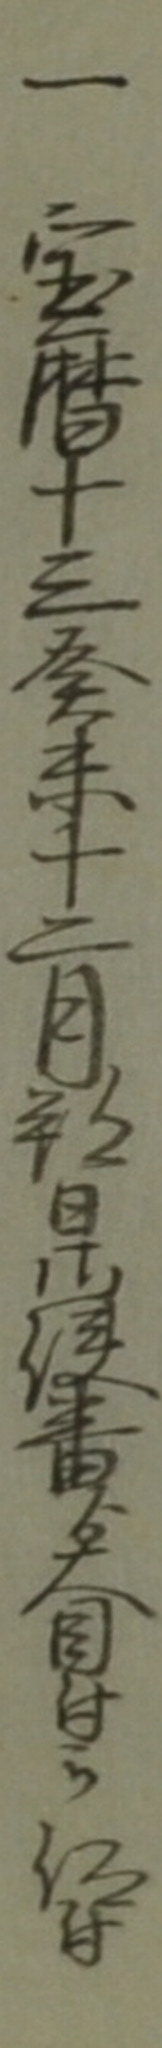一宝暦十三癸未十二月朔日御使番ゟ大目付被仰付
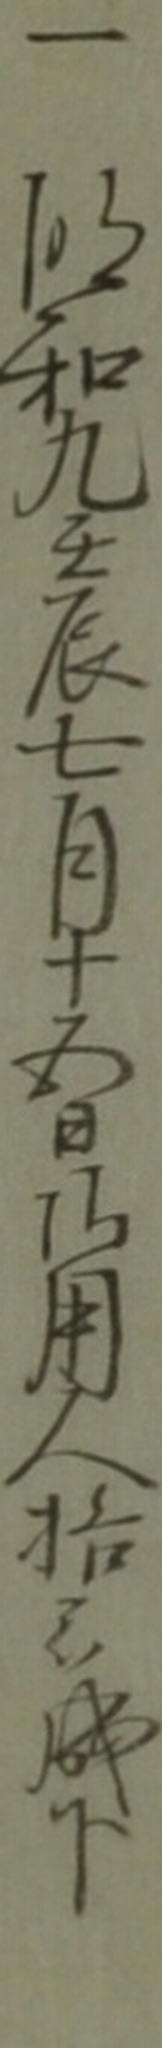一明和九壬辰七月十五日御用人格被成下
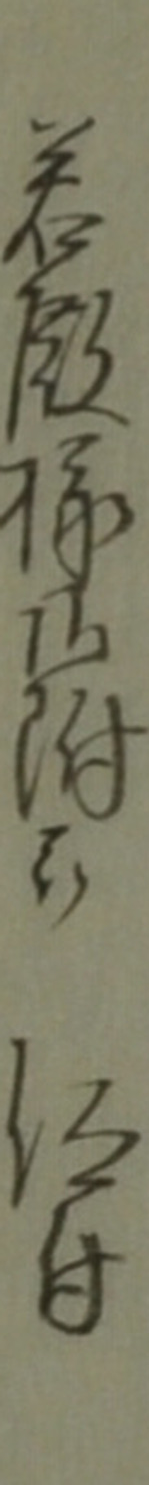若殿様御附被仰付
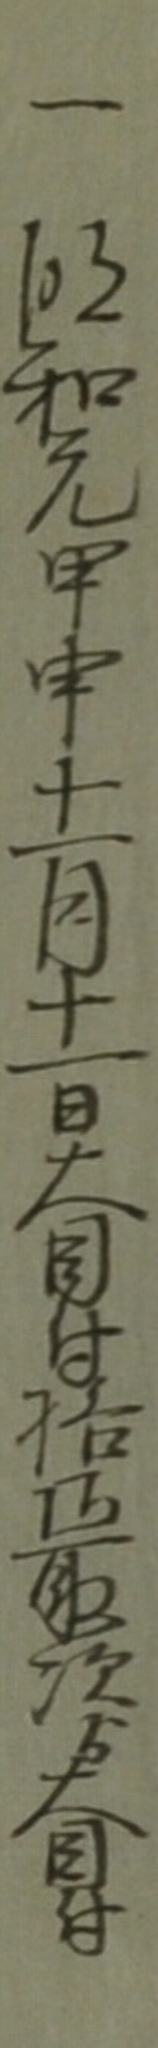一明和元甲申十一月十一日大目付格御取次ゟ大目付
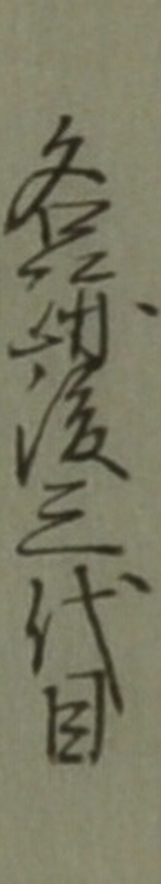名跡後三代目
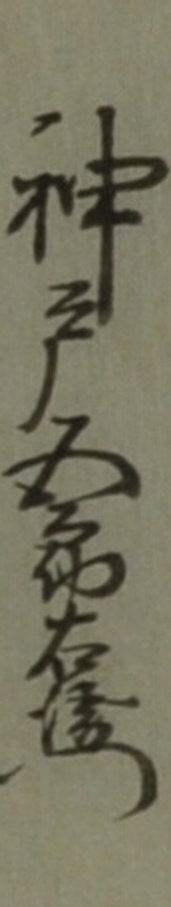神戸五郎右衛門
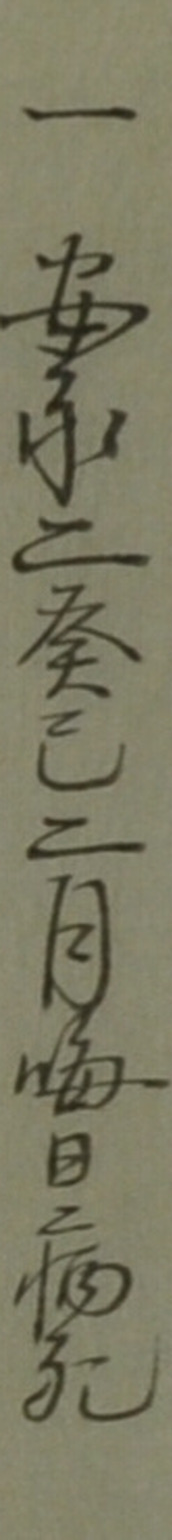一安永二癸巳二月晦日病死
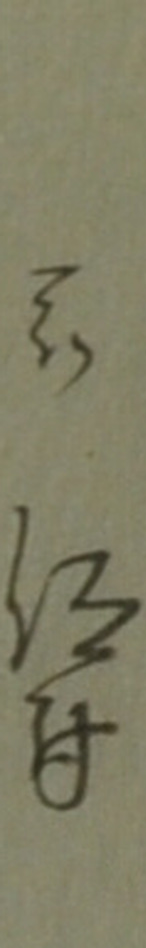被仰付
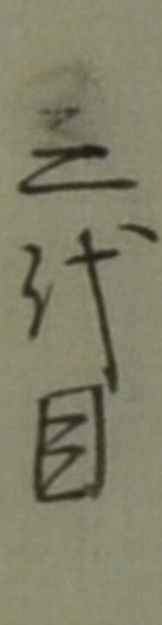三代目
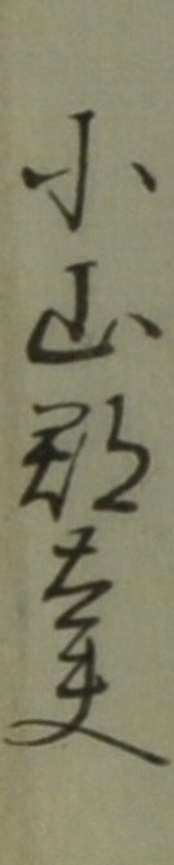小山郡太夫

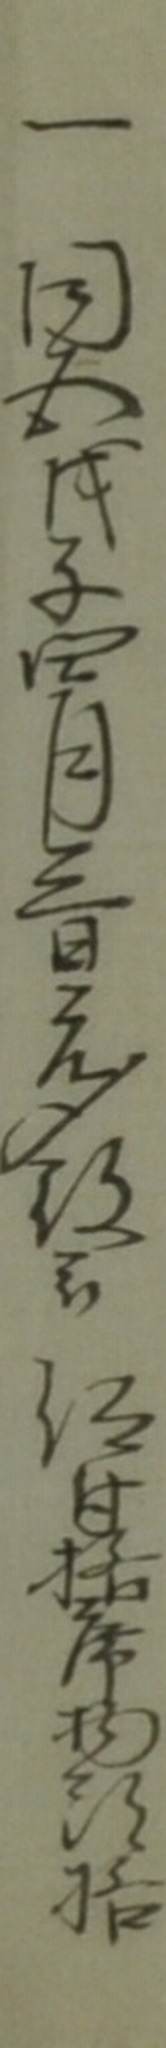一同五戊子四月三日元〆役被仰付格席物頭格
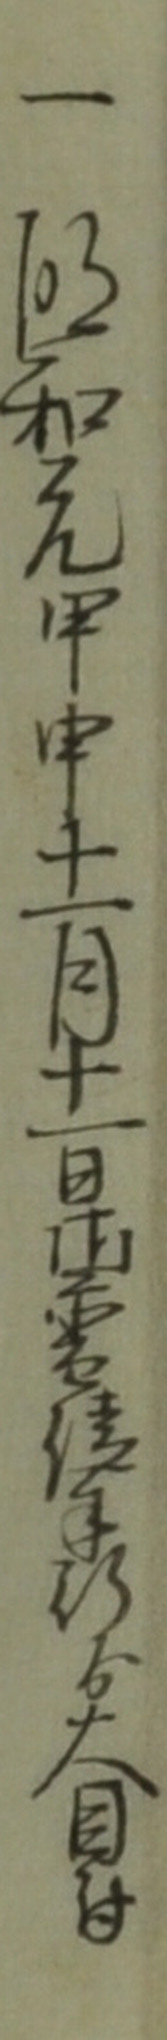一明和元甲申十一月十一日御普請奉行ゟ大目付
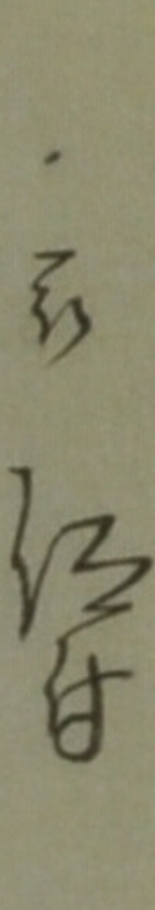被仰付
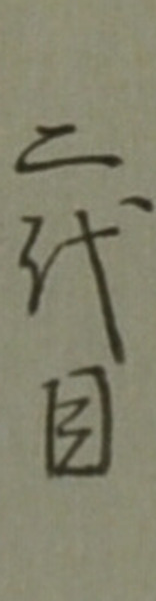二代目
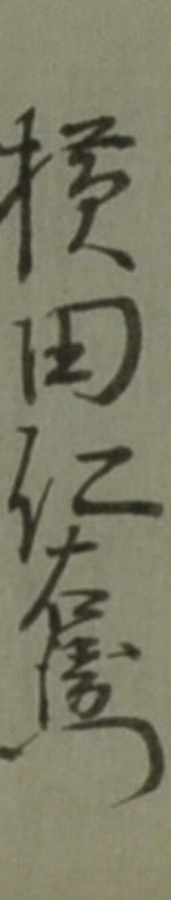横田仁右衛門
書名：諸御役代々録（三）
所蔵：伊那市立高遠町図書館・合同会社AMANE
